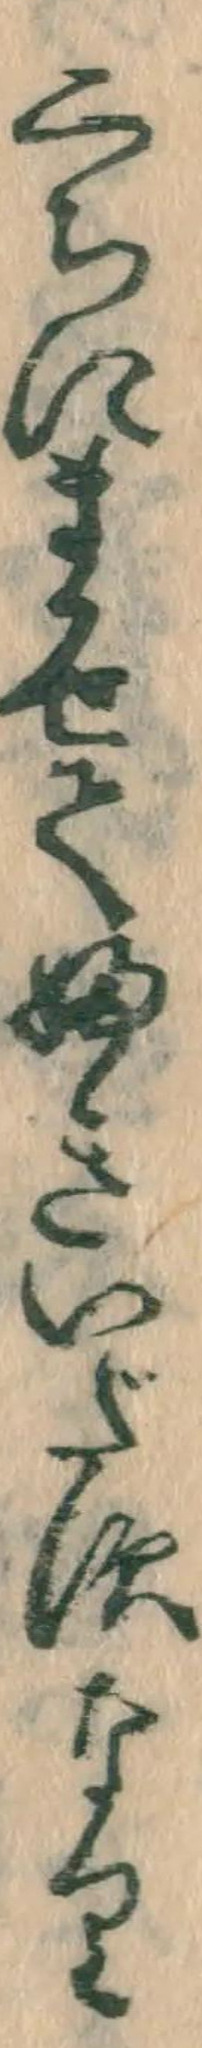くちにまかせてふきいだすなり

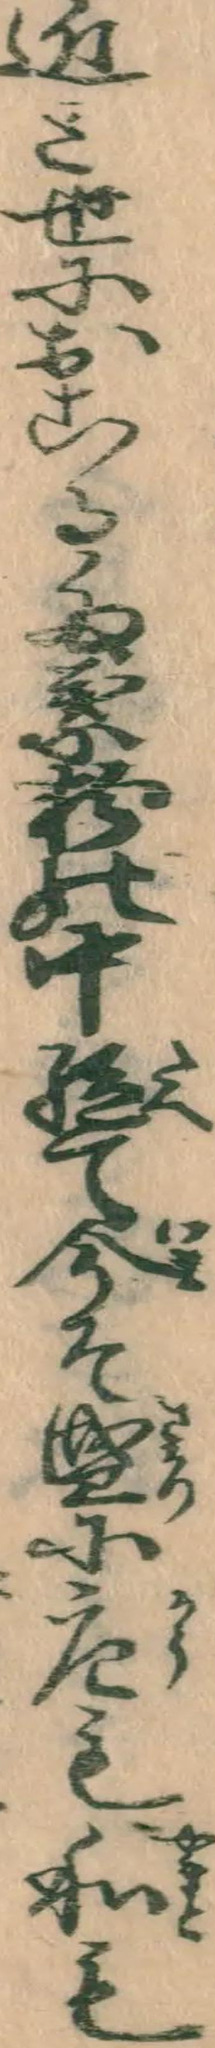近き世におこる多葉粉の中絶て今そ盛に唐も和も
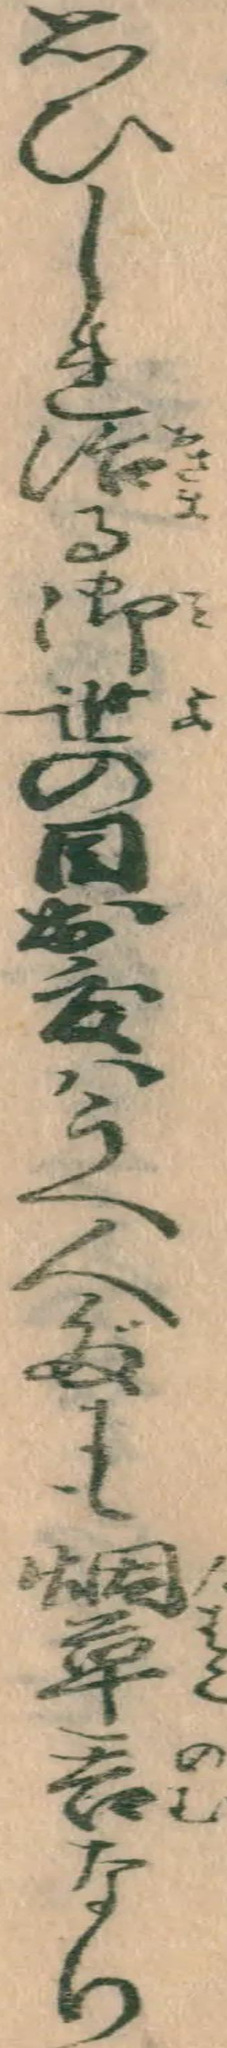思ひしれ治る御世の目出度はうへ人だにも烟草呑なり
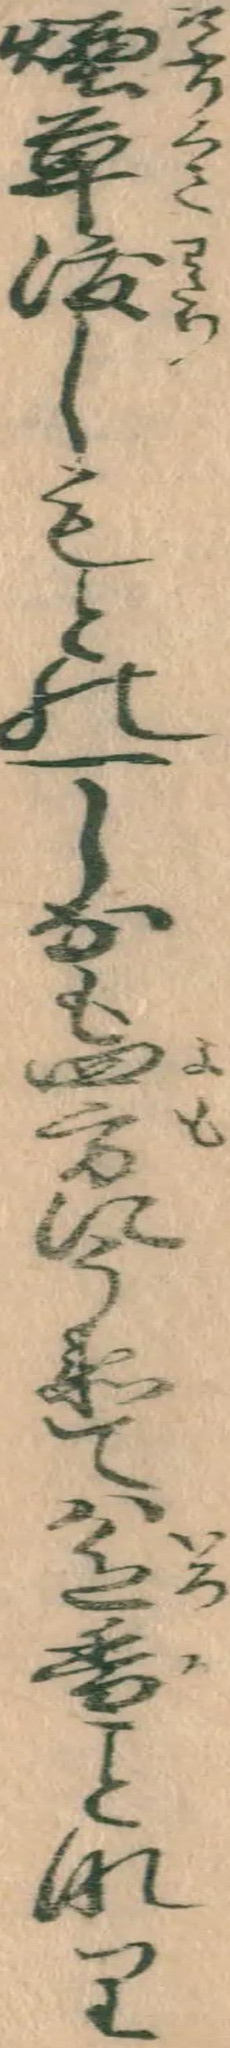煙草渡しもとの一しなも四方にうゑては色香ことなり
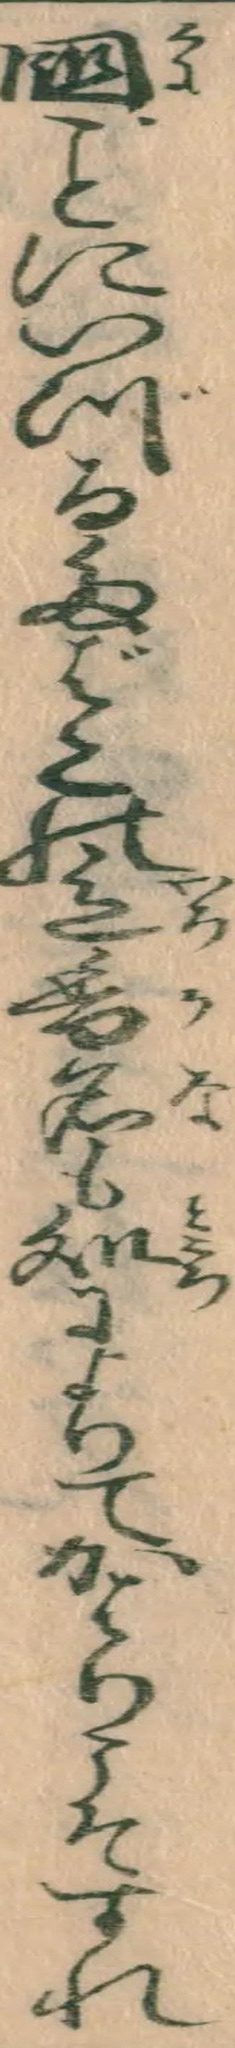国ことにいづるたばこの色香名も処によりてかはりこそすれ
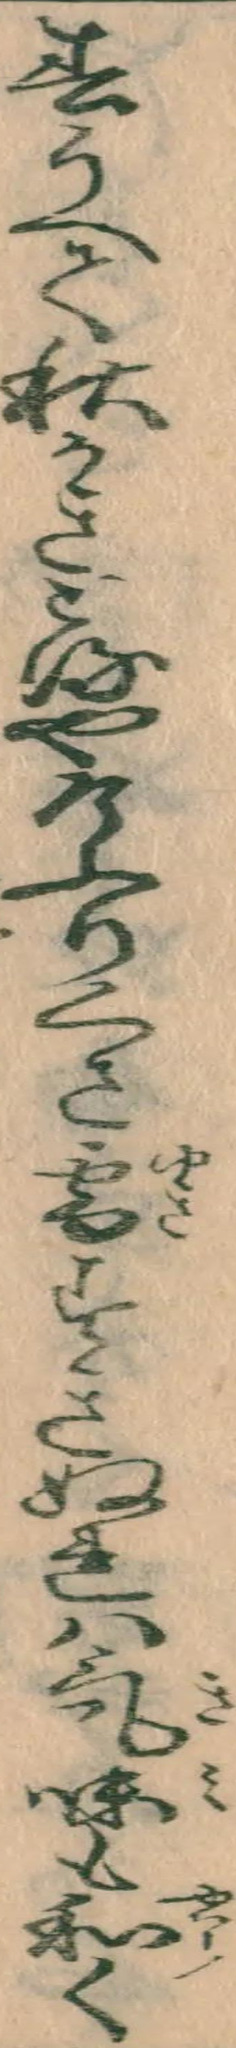春うへて秋かきとるやけふりくさ雪すきぬれは気味も和く
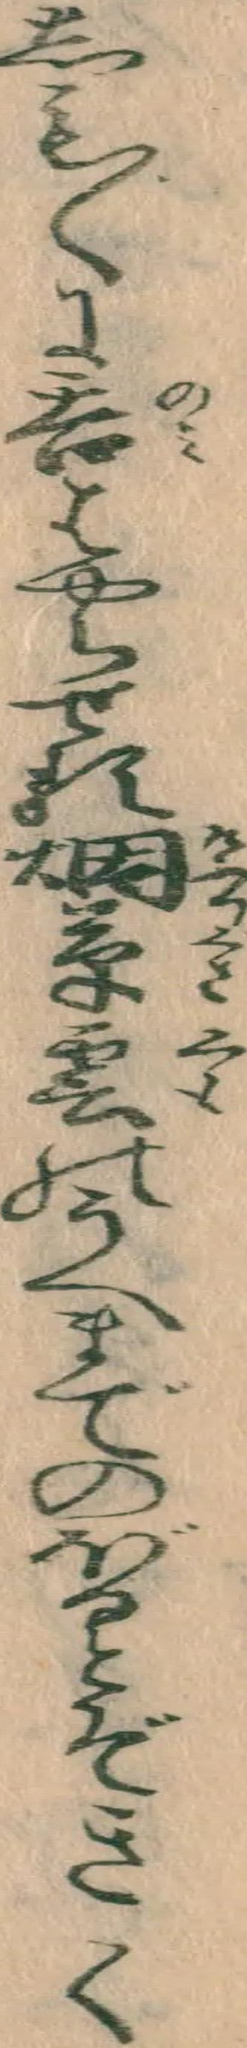しも〳〵に呑はやらせる烟草雲のうへまでのぼるとぞきく
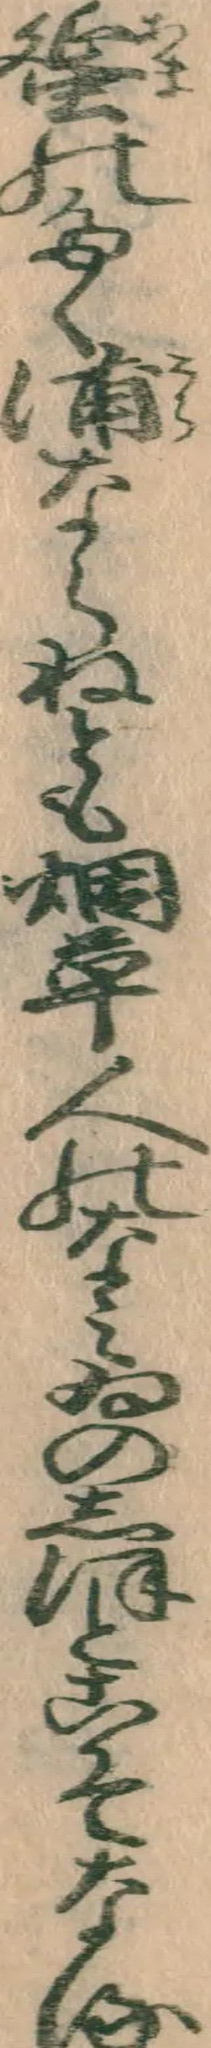蜑のたく浦ならねとも烟草人のなみゐのしほとこそなる
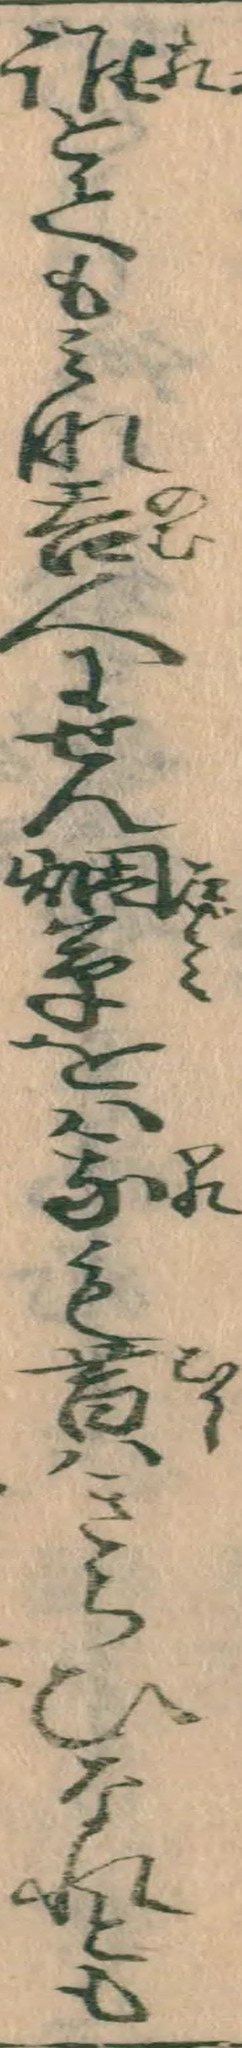誰とてもみな呑人にせん烟草をは我も昔はきらひなれとも
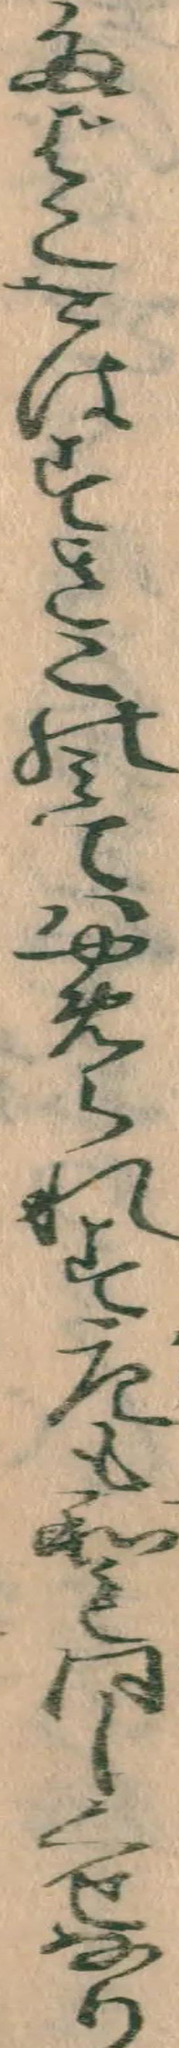たばこをはすきこのみてはやめられす唐も和も同しくせなり
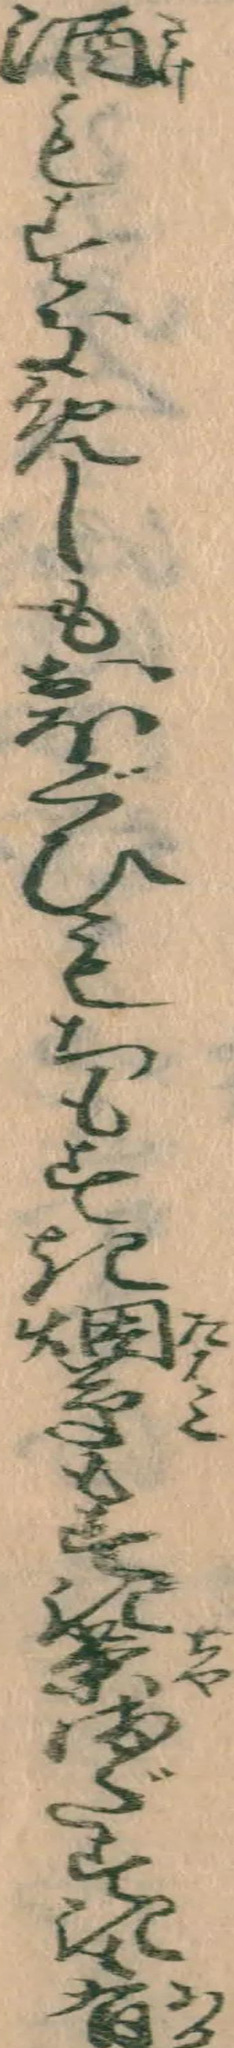酒もすきめしもおほぐひもちもすき烟草もすき茶まだすきも有
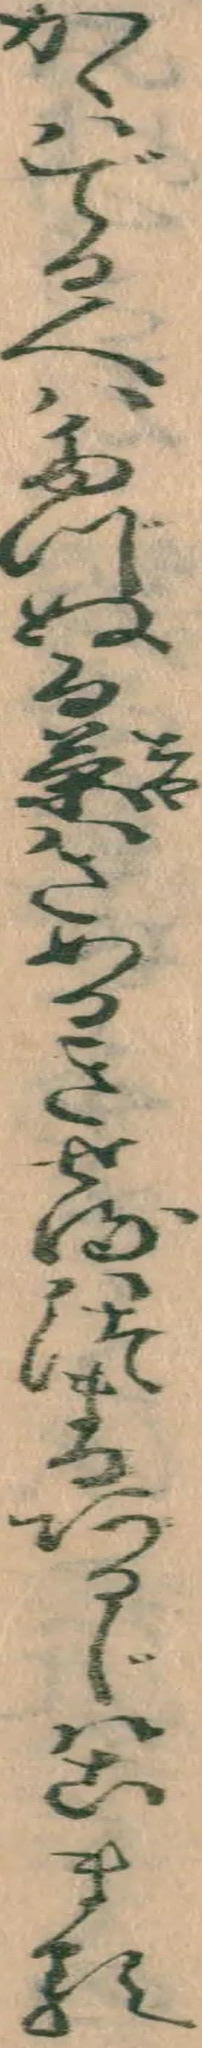かゝはでる人はたづぬる茶はさめるきせるはつまるあるじはこまる
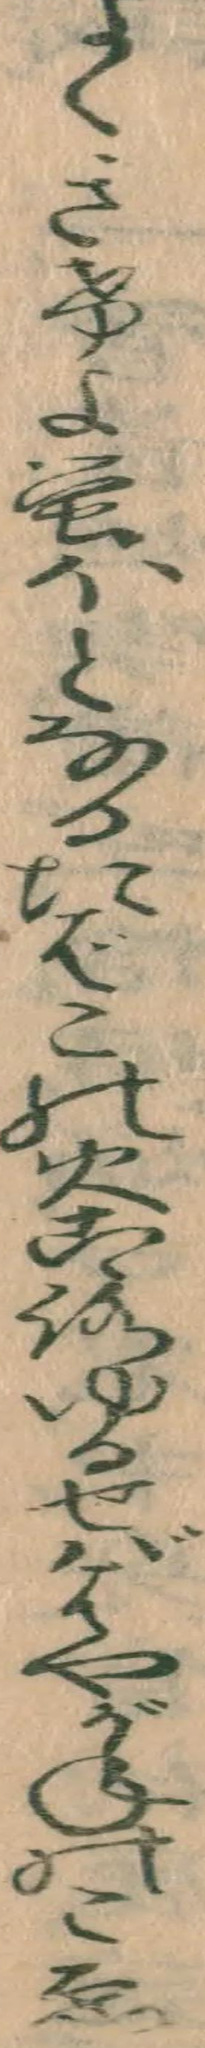よくきけよ蛍ほとなるたばこの火こゝろゆるせばはやがねのこゑ
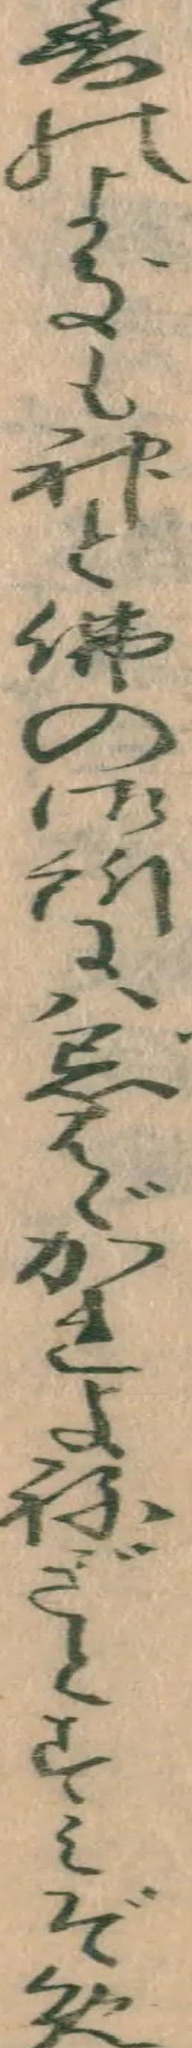香のよきも神と仏の御所には忌はゞかれよねぎとすみぞめ
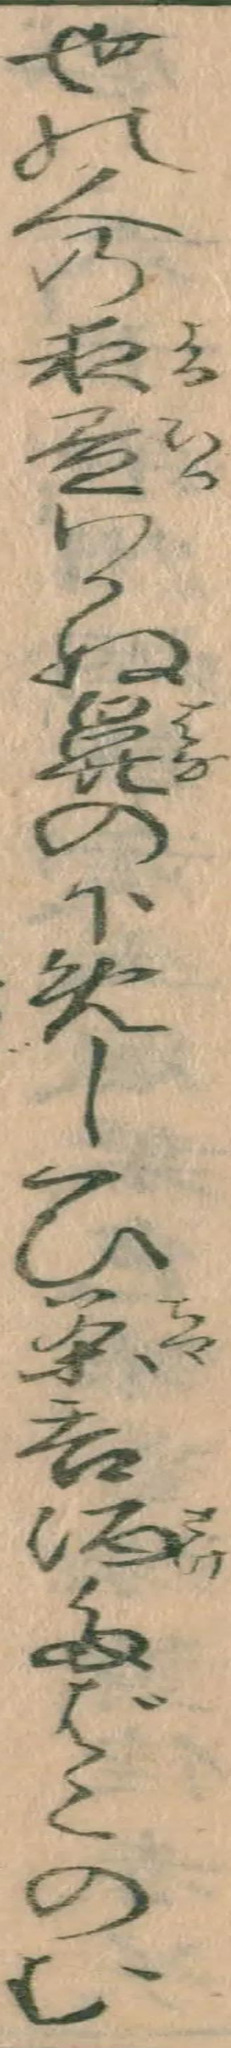世の人の夜昼わかぬ鼻の下めしくひ茶呑酒たばこのむ
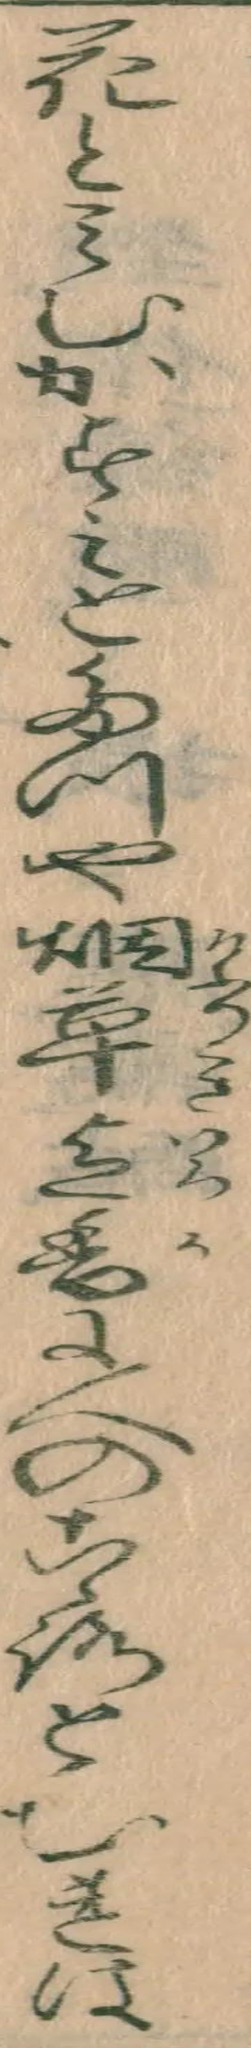花とみむかすみとたつや烟草色香に人のこゝろとむれは
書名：煙草記
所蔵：国立国会図書館 National Diet Library, JAPAN
